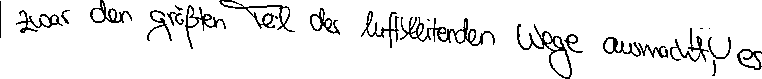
zwar den größten Teil der luftleitenden Wege ausmacht, es
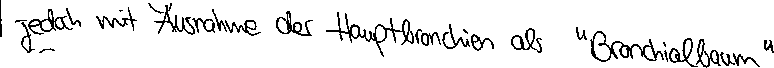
jedoch mit Ausnahme der Hauptbronchien als "Bronchialbaum"
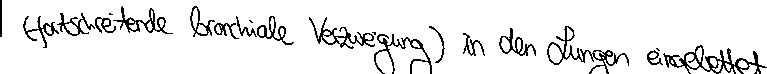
(fortschreitende bronchiale Verzweigung) in den Lungen eingebettet
